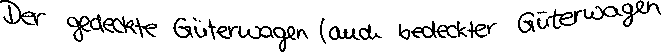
Der gedeckte Güterwagen (auch bedeckter Güterwagen
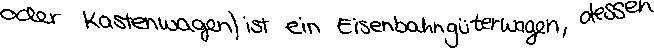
oder Kastenwagen) ist ein Eisenbahngüterwagen, dessen
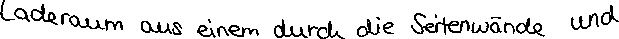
Laderaum aus einem durch die Seitenwände und
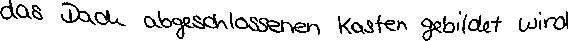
das Dach abgeschlossenen Kasten gebildet wird
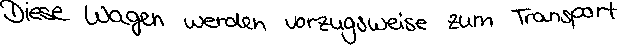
Diese Wagen werden vorzugsweise zum Transport
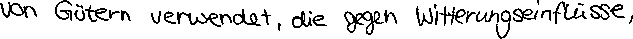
von Gütern verwendet, die gegen Witterungseinflüsse,
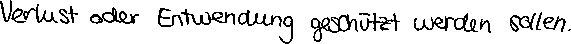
Verlust oder Entwendung geschützt werden sollen.
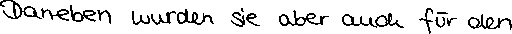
Daneben wurden sie aber auch für den
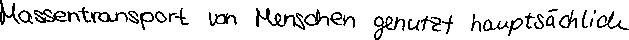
Massentransport von Menschen genutzt hauptsächlich
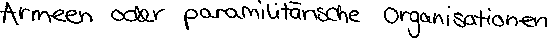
Armeen oder paramilitärische Organisationen
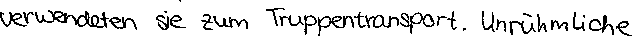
verwendeten sie zum Truppentransport. Unrühmliche
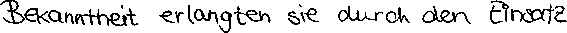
Bekanntheit erlangten sie durch den Einsatz
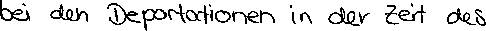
bei den Deportationen in der Zeit des
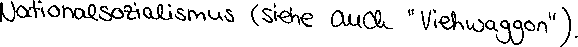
Nationalsozialismus (siehe auch "Viehwaggon").
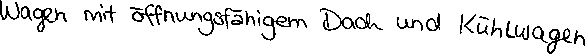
Wagen mit öffnungsfähigem Dach und Kühlwagen
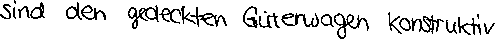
sind den gedeckten Güterwagen konstruktiv
